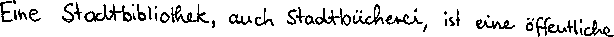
Eine Stadtbibliothek, auch Stadtbücherei, ist eine öffentliche
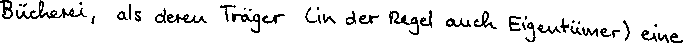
Bücherei, als deren Träger (in der Regel auch Eigentümer) eine
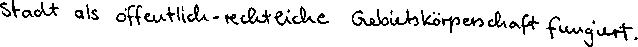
Stadt als öffentlich-rechtliche Gebietskörperschaft fungiert.
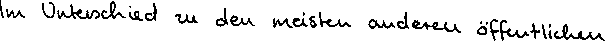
Im Unterschied zu den meisten anderen öffentlichen
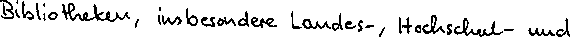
Bibliotheken, insbesondere Landes-, Hochschul- und
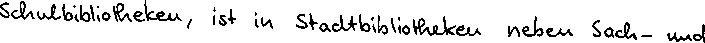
Schulbibliotheken, ist in Stadtbibliotheken neben Sach- und
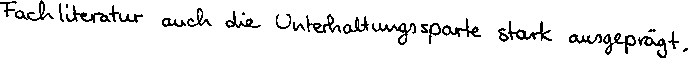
Fachliteratur auch die Unterhaltungssparte stark ausgeprägt.
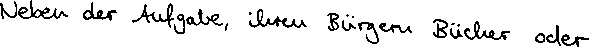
Neben der Aufgabe, ihren Bürgern Bücher oder
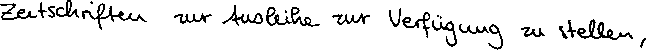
Zeitschriften zur Ausleihe zur Verfügung zu stellen,
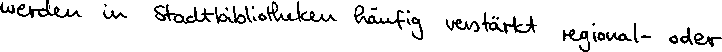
werden in Stadtbibliotheken häufig verstärkt regional- oder
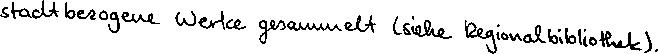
stadtbezogene Werke gesammelt (siehe Regionalbibliothek).
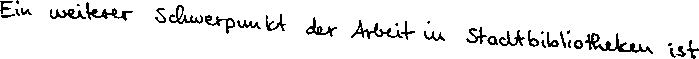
Ein weiterer Schwerpunkt der Arbeit in Stadtbibliotheken ist
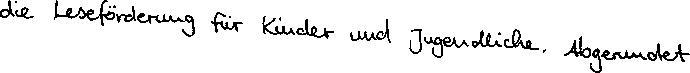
die Leseförderung für Kinder und Jugendliche. Abgerundet
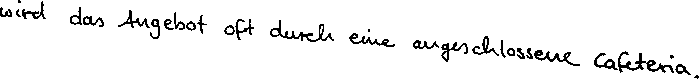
wird das Angebot oft durch eine angeschlossene Cafeteria.
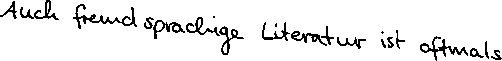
Auch fremdsprachige Literatur ist oftmals
